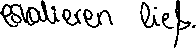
eskalieren ließ.
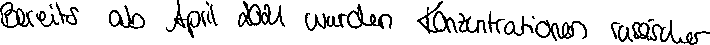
Bereits ab April 2021 wurden Konzentrationen russischer
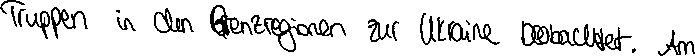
Truppen in den Grenzregionen zur Ukraine beobachtet. Am
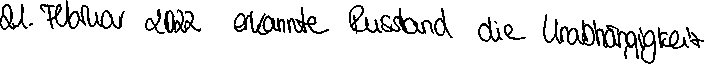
21. Februar 2022 erkannte Russland die Unabhängigkeit
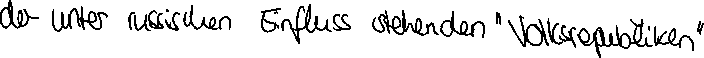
der unter russischem Einfluss stehenden "Volksrepubliken"
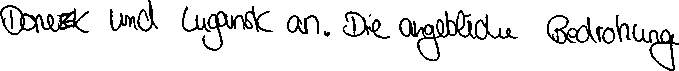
Donezk und Lugansk an. Die angebliche Bedrohung
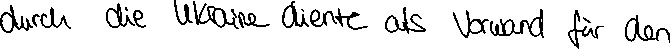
durch die Ukraine diente als Vorwand für den
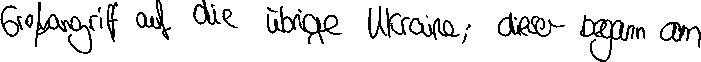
Großangriff auf die übrige Ukraine; dieser begann am
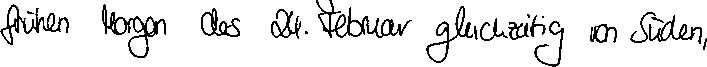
frühen Morgen des 24. Februar gleichzeitig von Süden,
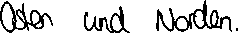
Osten und Norden.
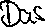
Das
